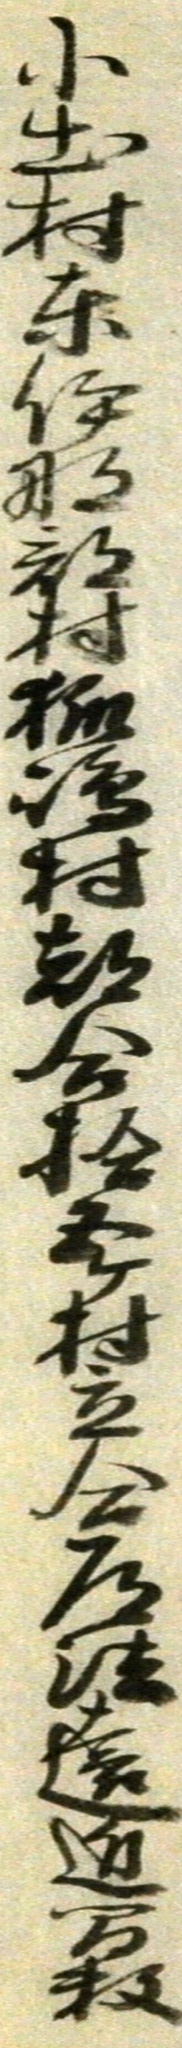小出村東伊那部村狐嶋村都合拾五ヶ村立会道法遠近間数
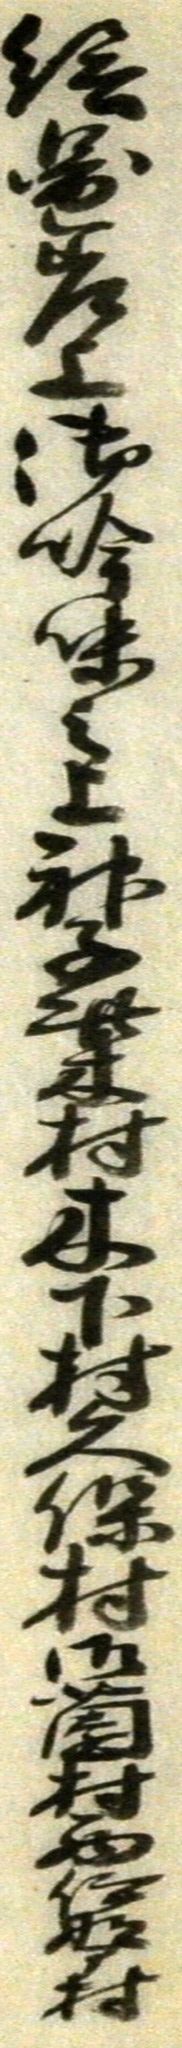絵図差上御吟味之上神子柴村木下村久保村御薗村西伊那部村
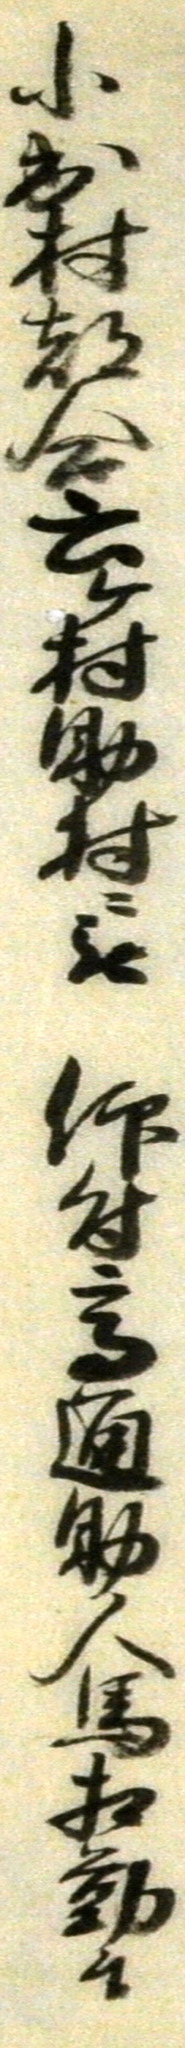小出村都合六ヶ村助村ニ被仰付高通助人馬相勤候
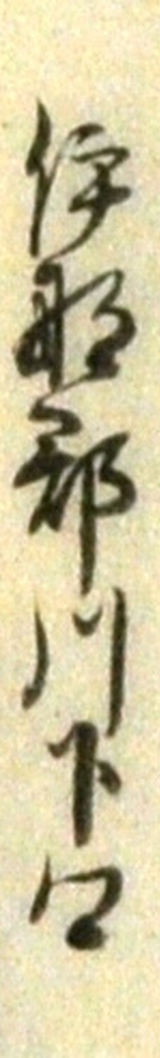伊那郡川下郷
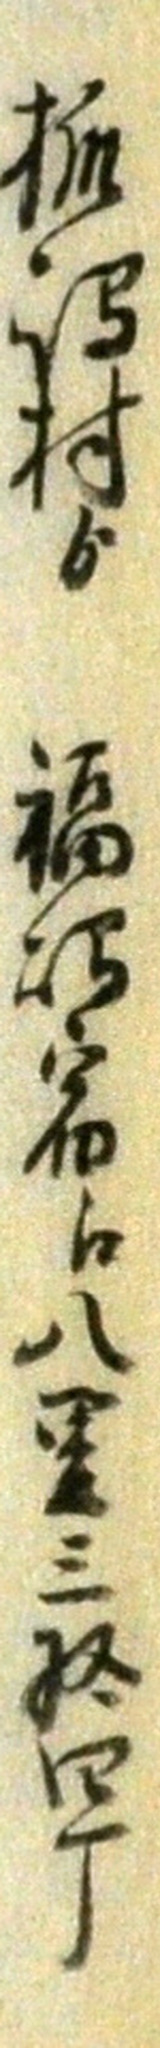狐嶋村ゟ福嶋宿江八里三拾四丁
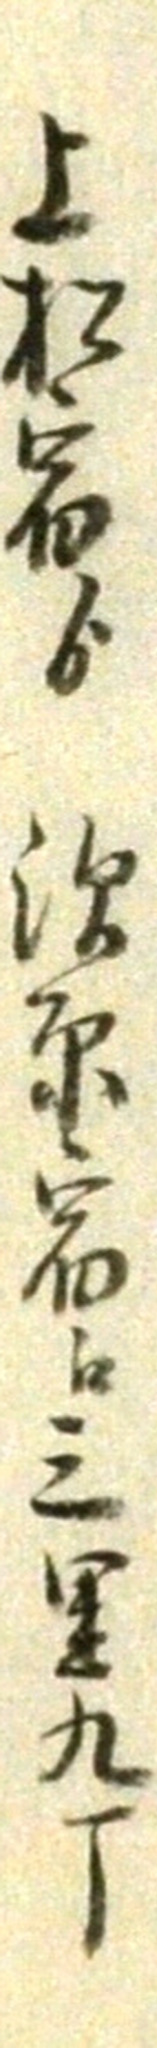上松宿ゟ須原宿江三里九丁
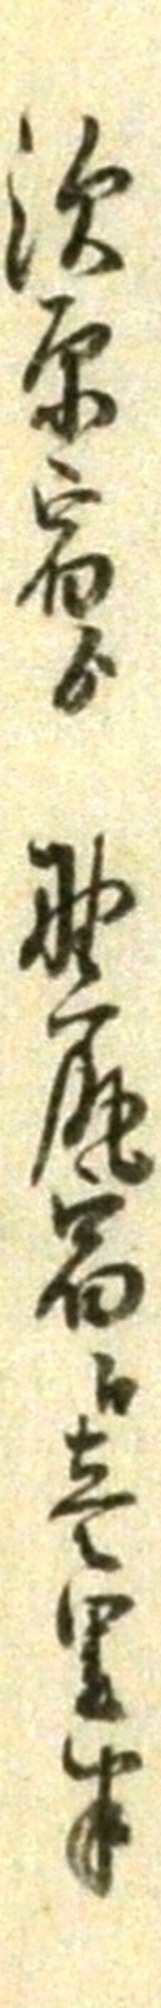須原宿ゟ野尻宿江壱里半
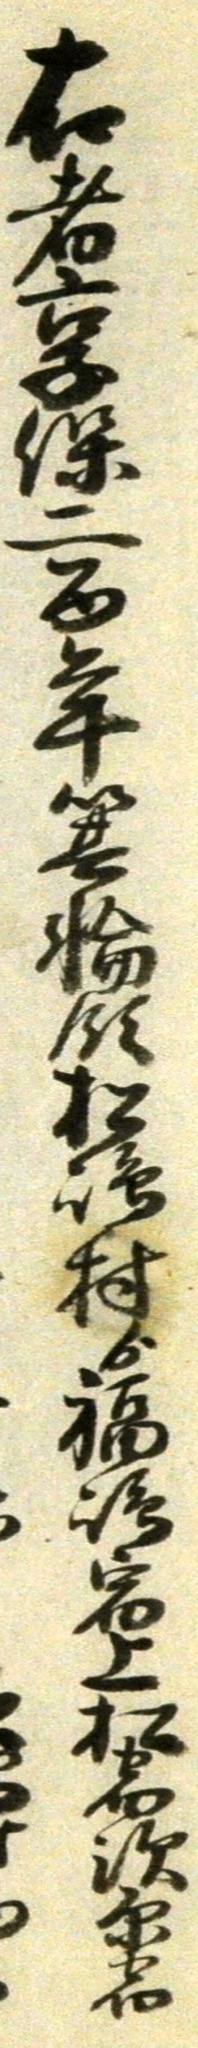右者享保弐丙年箕輪領松嶋村ゟ福嶋宿上松宿須原宿
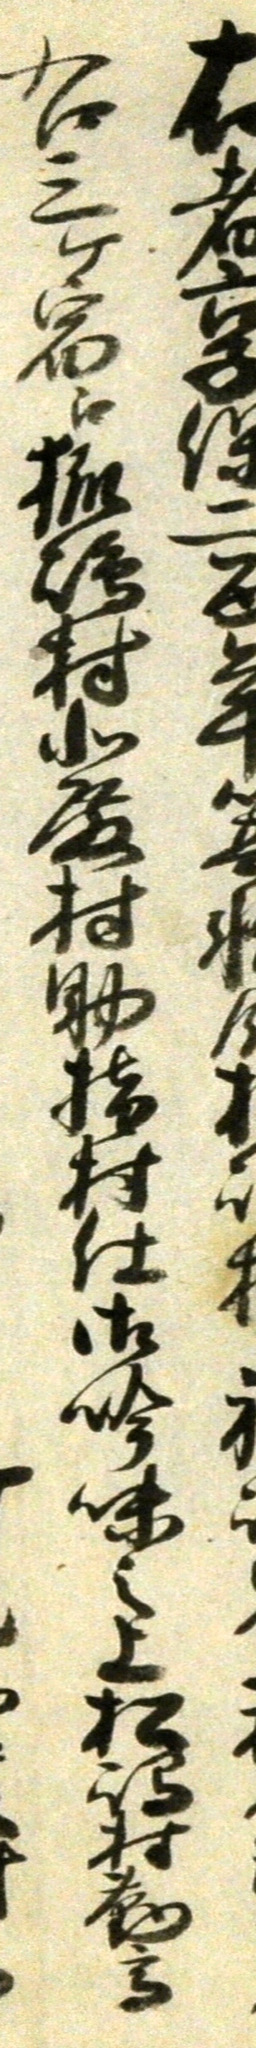右三ヶ宿江狐嶋村北殿村助指村仕御吟味之上松嶋村勤高
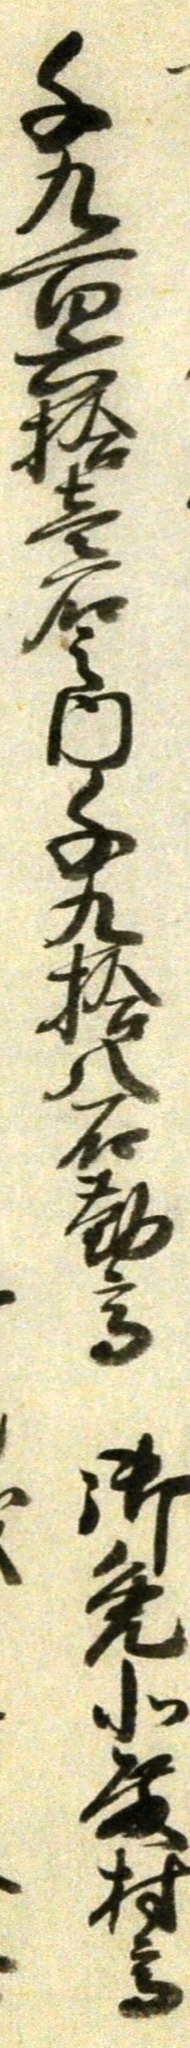千九百六拾壱石之内千九拾八石勤高御免北殿村高
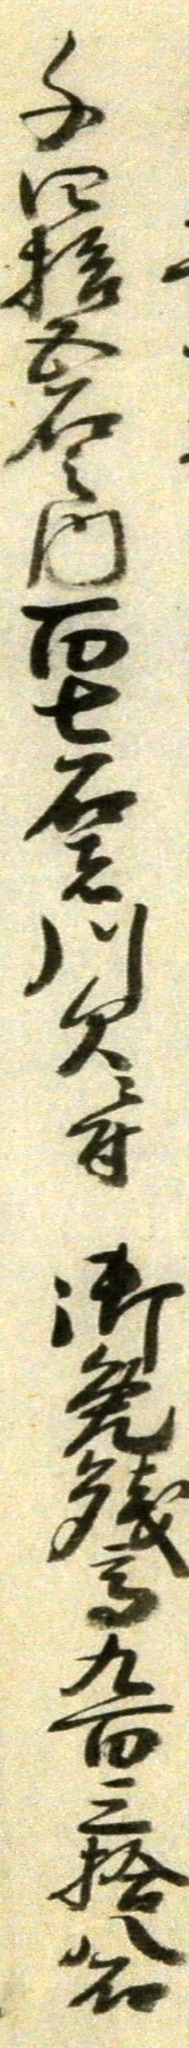千四拾五石之内百七石者川欠ニ付御免残高九百三拾八石
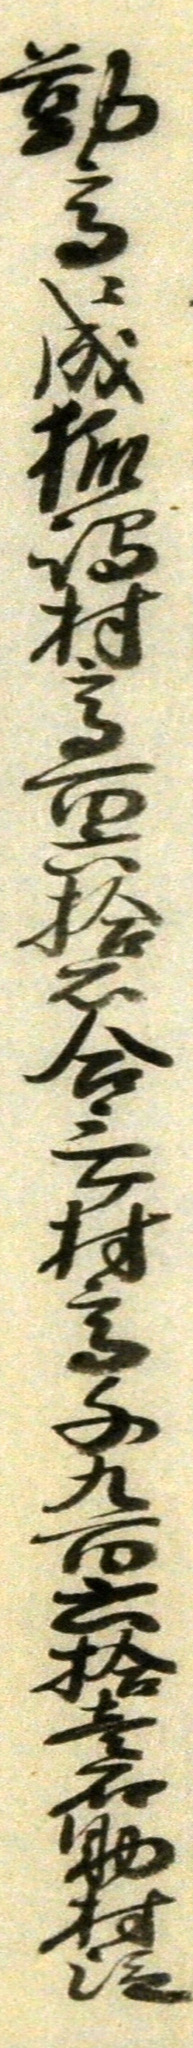勤高ニ成狐嶋村高百六拾石合三ヶ村高千九百六拾壱石助村従
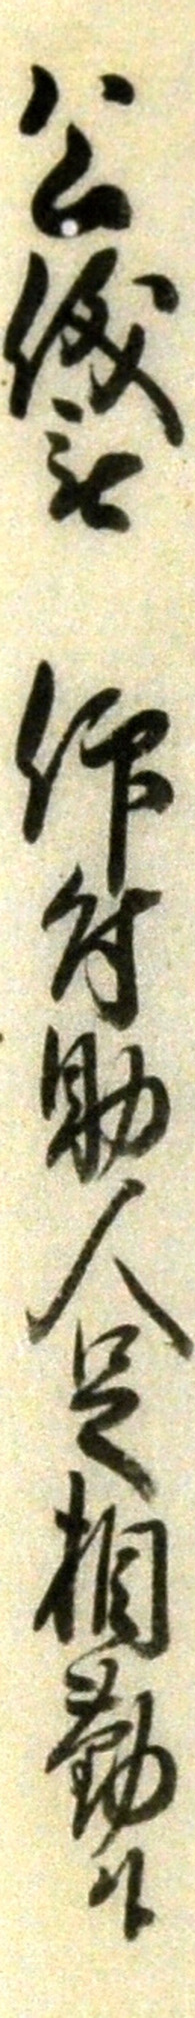公儀被仰付助人足相勤候

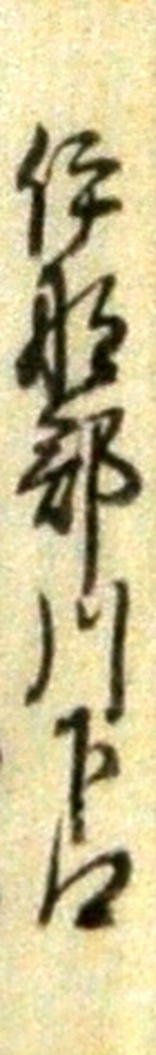伊那郡川下郷
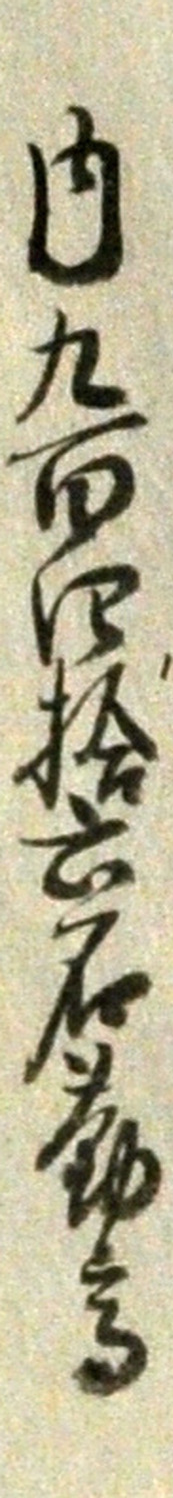内九百四拾六石勤高
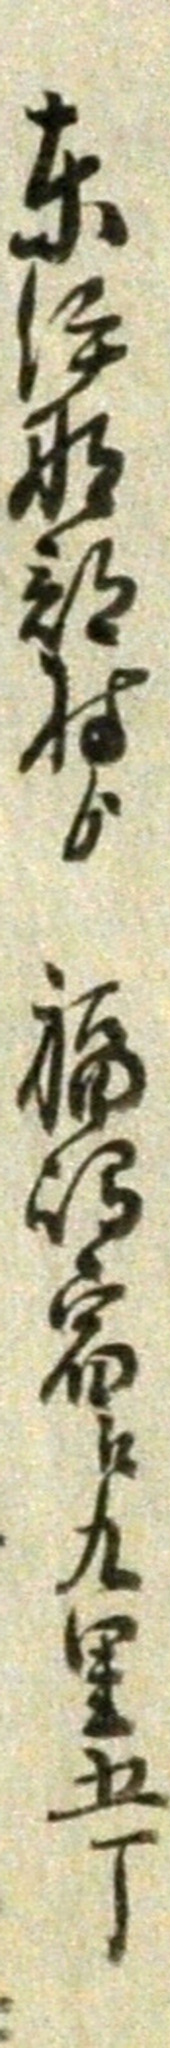東伊那部村ゟ福嶋宿江九里五丁
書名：御領分拾九箇村木曽助并塩尻町・洗馬町・本山町へ人馬勤覚帳
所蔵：伊那市立高遠町図書館・合同会社AMANE
